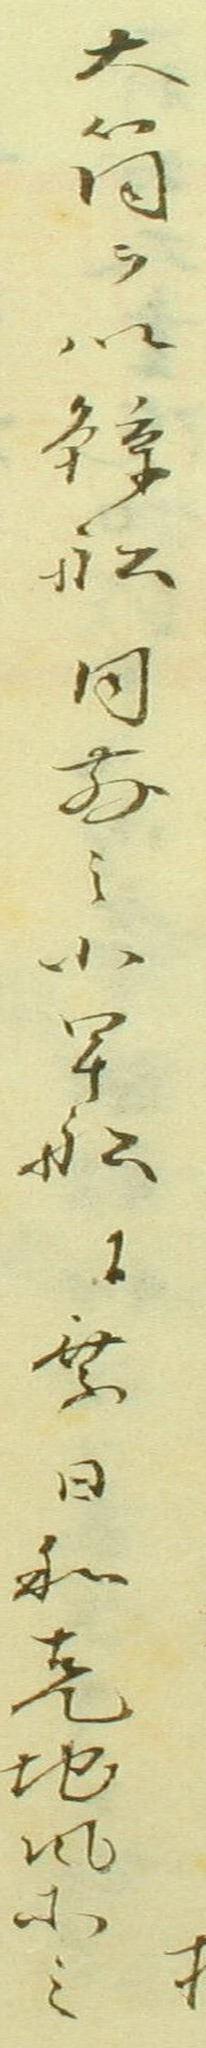大筒ヲ以鯨船同前之小早船に乗日和克地風等之
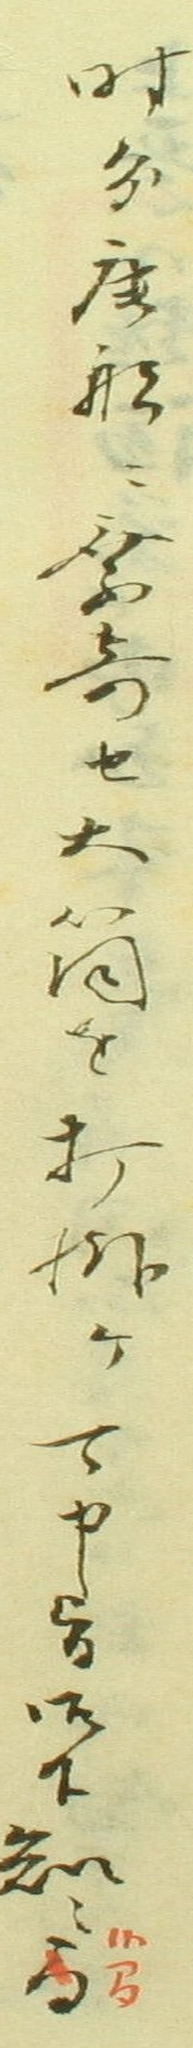時分唐船ニ乗寄せ大筒を打掛ケて申旨御下知
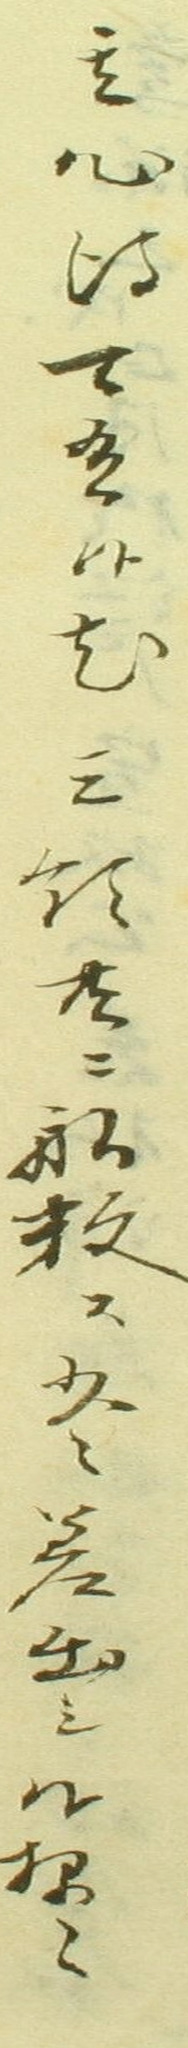其心得可有候尤三領共ニ船数ス少々差出シ候様に
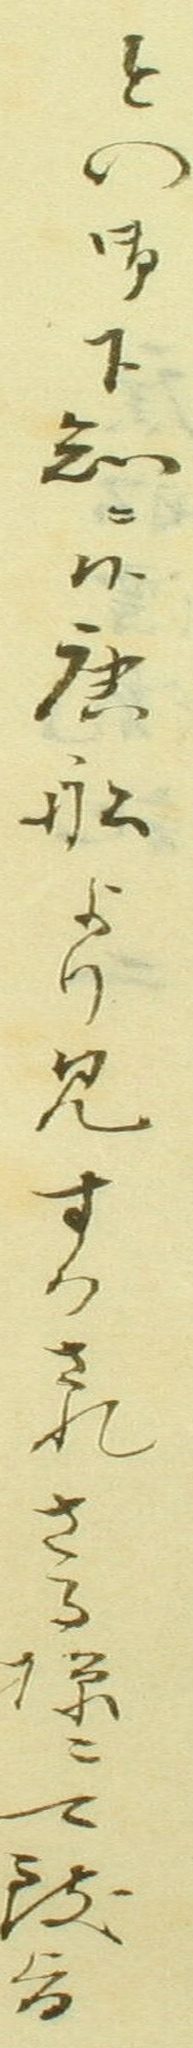との御下知ニ候唐船より見すかされさる様ニ可致旨
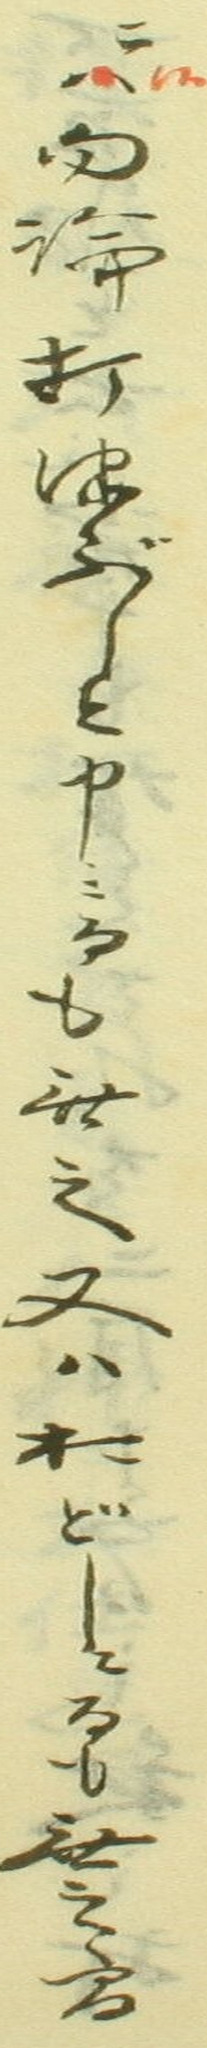ニ候勿論打つぶしと申ニ而も無之又はおどしとても無之候間
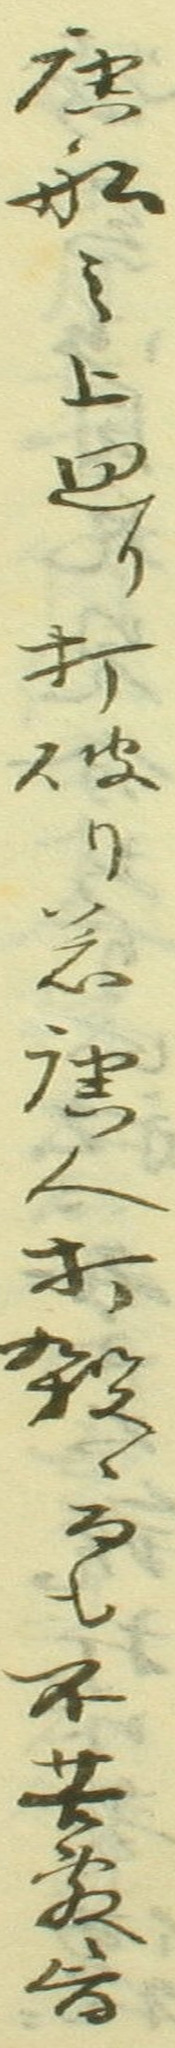唐船之上廻り打破り若唐人打殺候而も不苦敷候旨
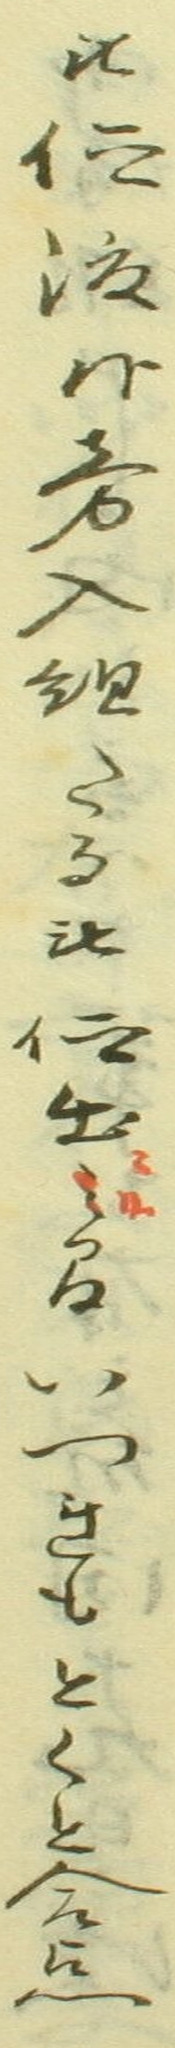被仰渡候旁入組たる被仰出間いつれもとくと合点
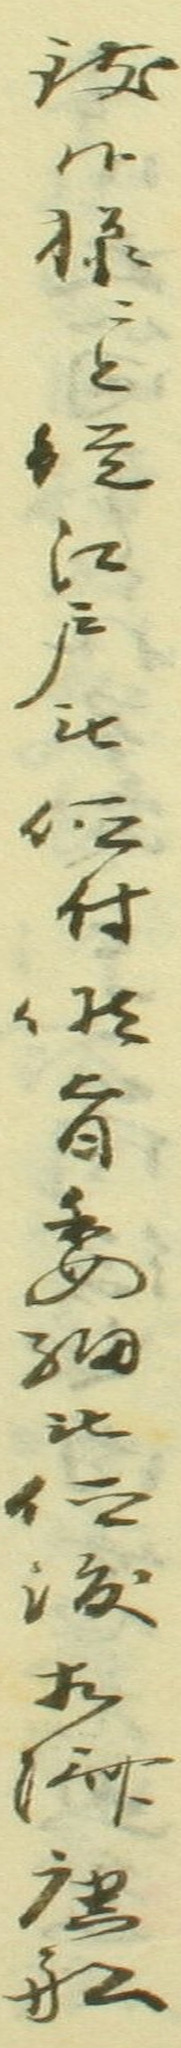致候様にと従江戸被仰付候旨委細被仰渡相済唐船
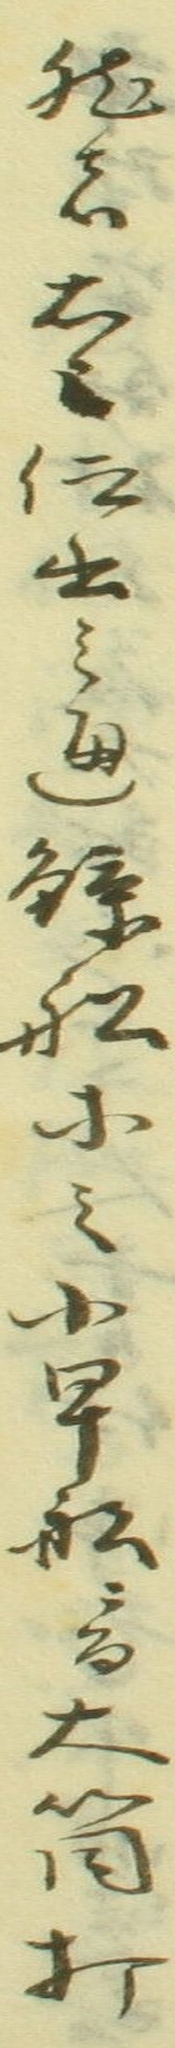然者右仰出之通鯨船ニて小早船に而大筒打
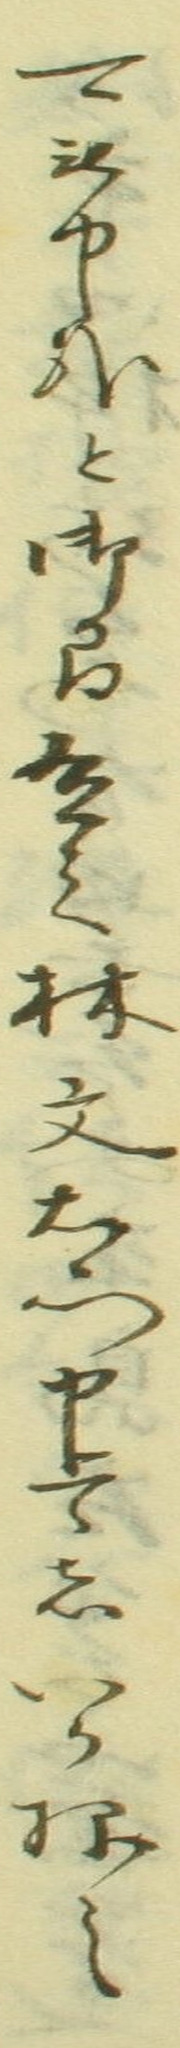可被申哉と御間有之林文右衛門申上候者いか様之
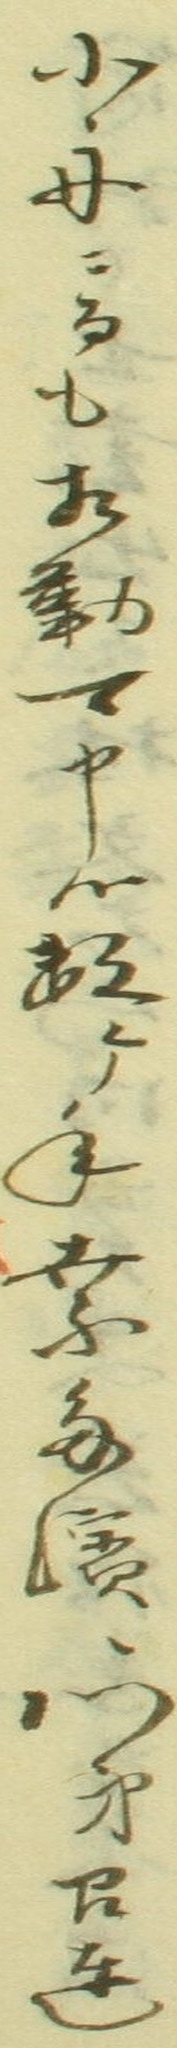小舟ニ而も相勤可申候数ケ年乗多浜へ門弟召連
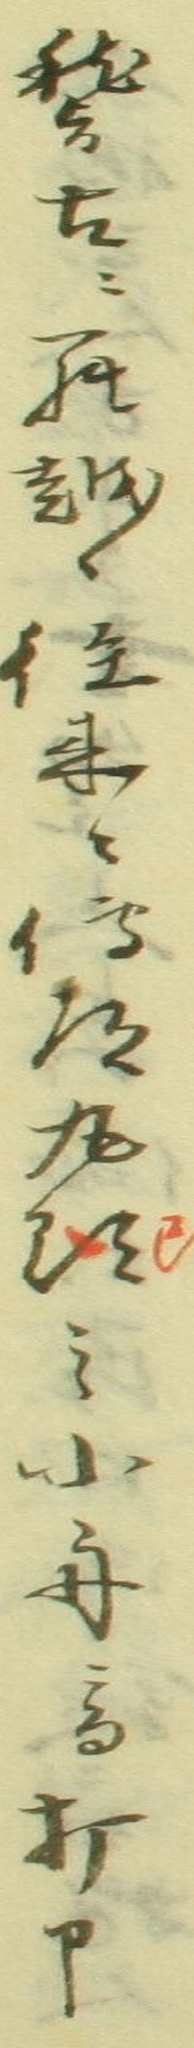稽古に罷越候往来と伝道丸之小舟ニ而打申
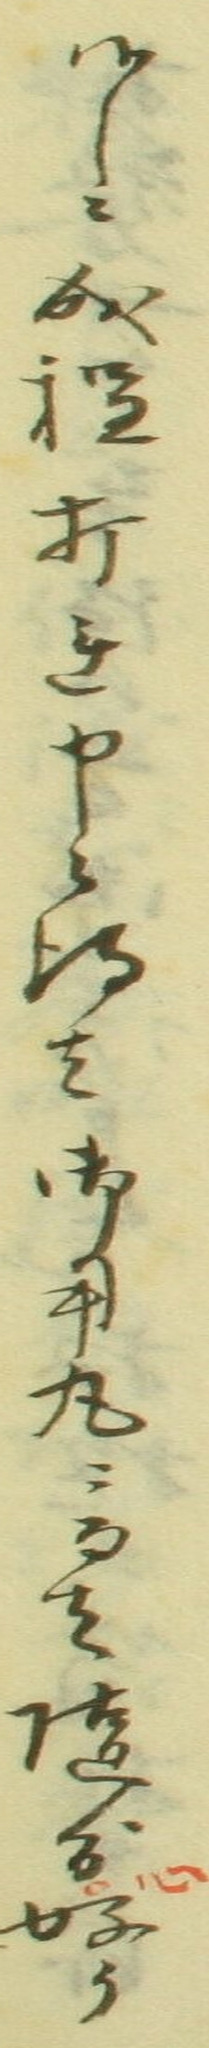候しと成程打れ申候得共御用丸ニ而は随分好う

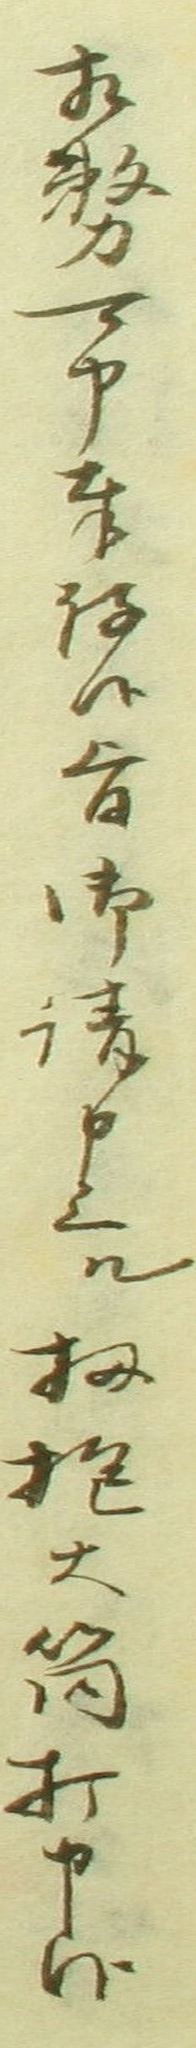相務可申奉存候旨御請申上ル扨抱大筒打申候
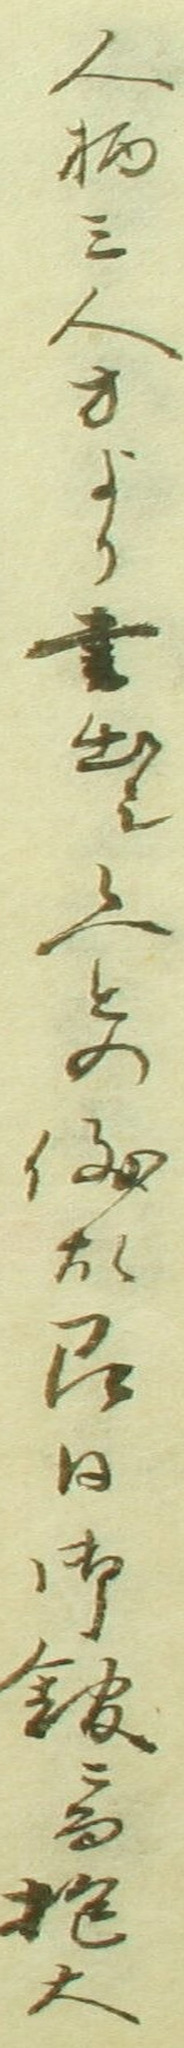人柄三人方より書出シ候へとの儀故即日御館ニ而抱大
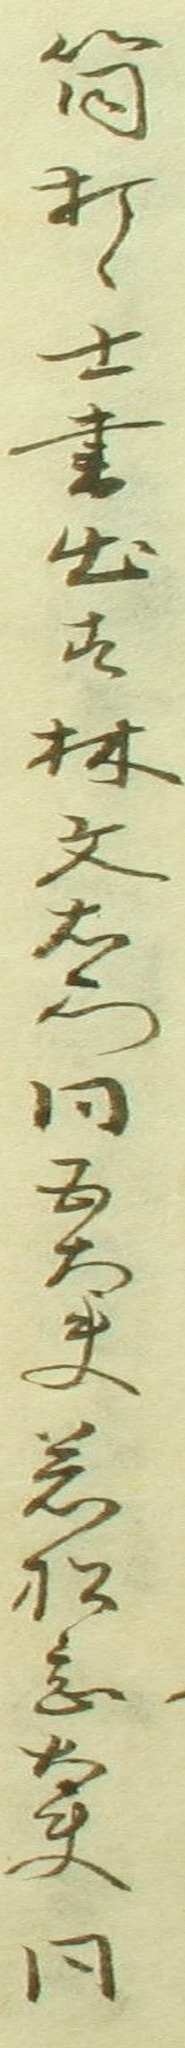筒打候士書出す林文右衛門同五太夫若松甚太夫同
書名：唐船漂流記 二
